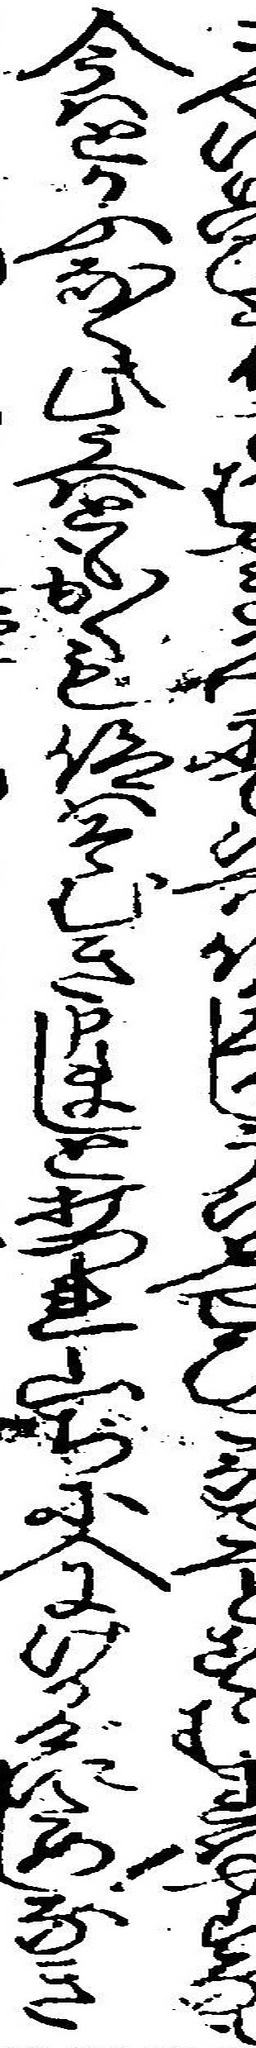今はとかふなく此うへはともかくも仰はそむき申ましと打つれ山ぢに入にけるげにためしなき
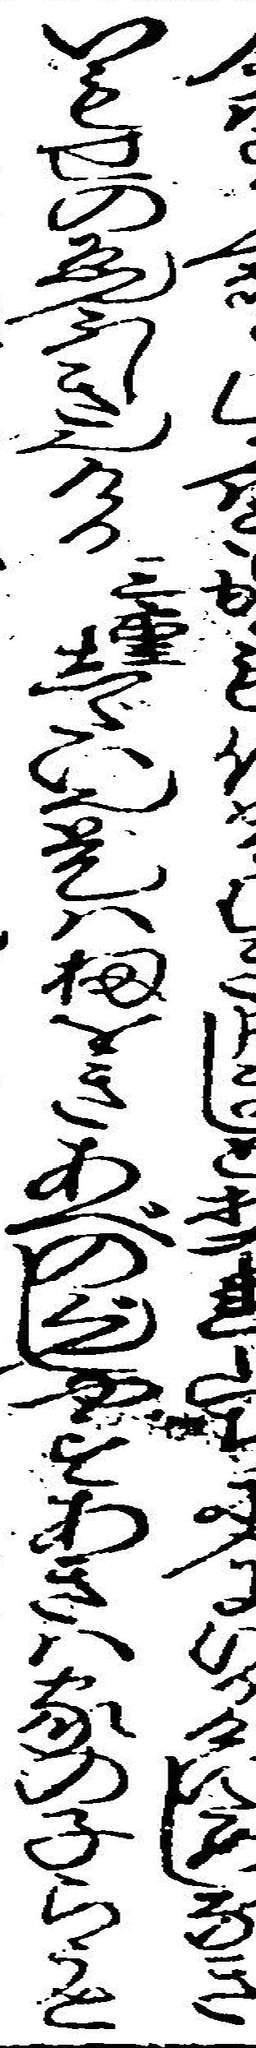いもせのゑんふしき也ける三重しだい也是は扨をきあべのぐんしやすあきは家の子らうと
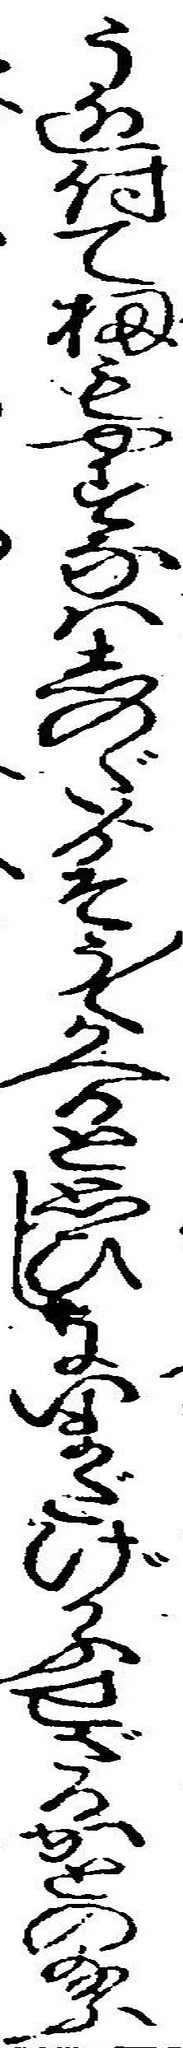う近付て扨もやすなはしのだよりそう〳〵かへると思ひしにいまだげかふせざるかとの給ふ
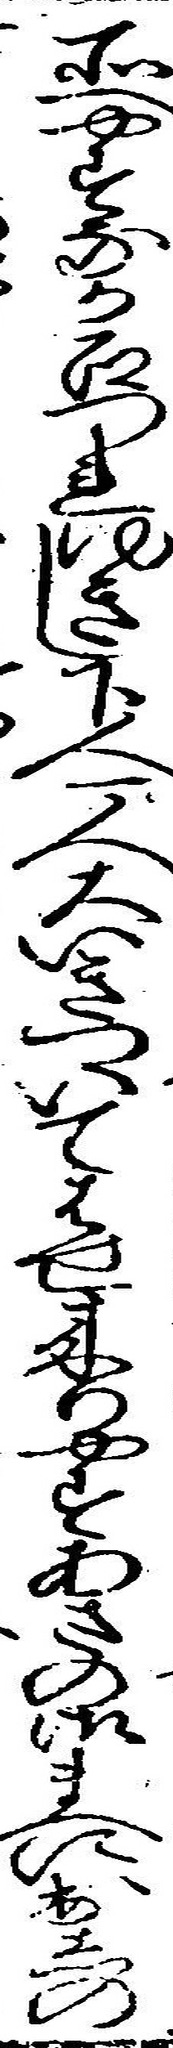所へやすなか召つれゆきし下人一人大いきついてはせ来りやすあきの御まへに出しの
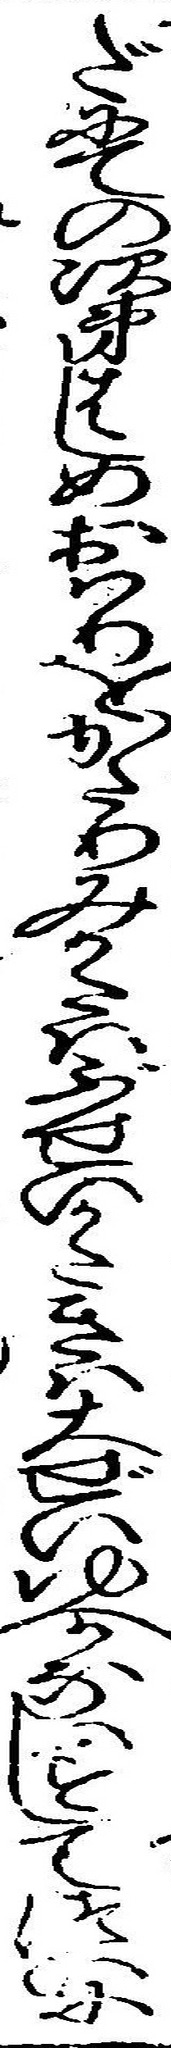だにての次第はしめおはりをかたりみかたはぶせいかたきは大ぜいゆへかなすしてついに
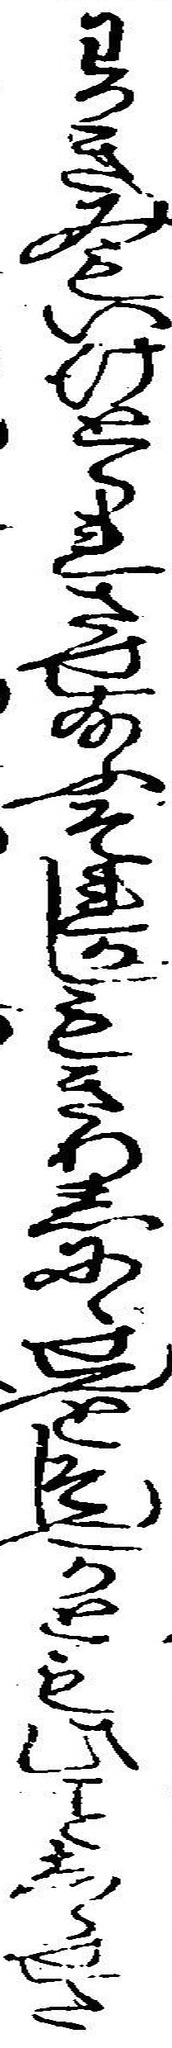わかきみもいけとられさせ給ふそれかしもきりしにゝせんとそんしかとも此ことしらせた
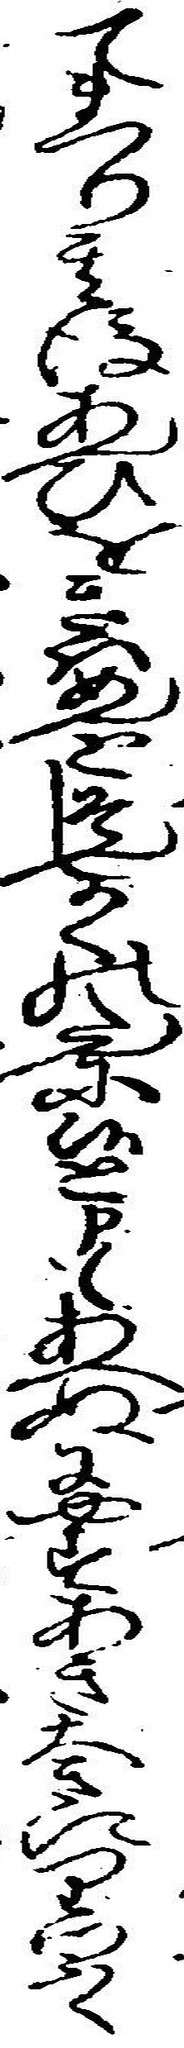てまつり其後あんひをきはめんとそんしかくのたんに候と申もあへぬにやすあき大きにりつふく
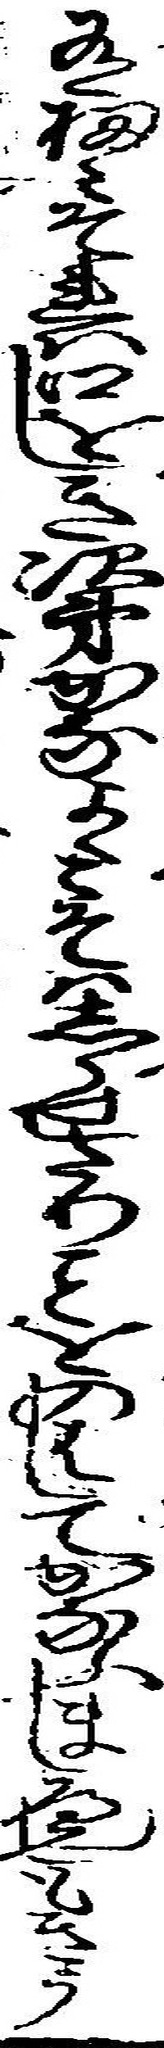有扨々それは口をしき次第かなよくこそはしらせたりことをのはしてかなふましへんしもきう
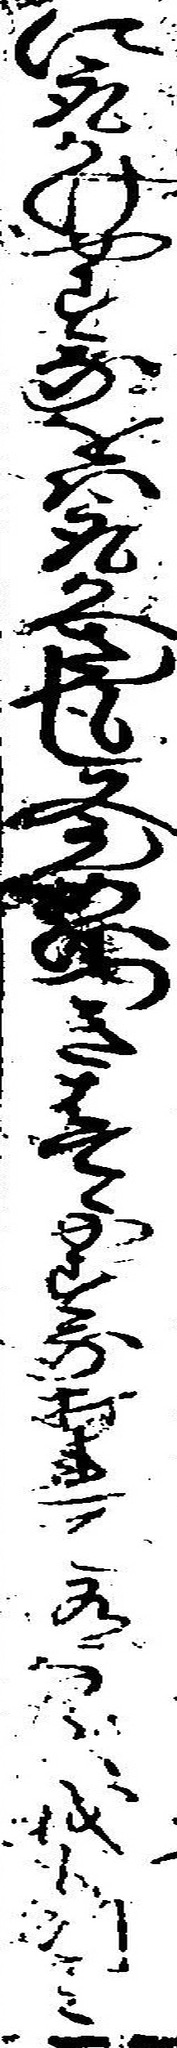に取かけやすなをは取かへさんもし又うんめいつきはてゝやすな打れて有ならは我も則其
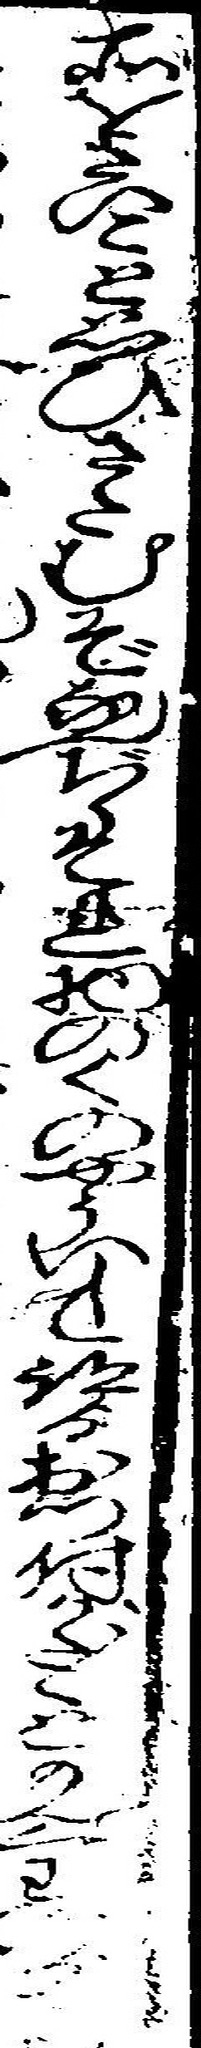所をさいこと思ひさたむぞなんぢらそれ物のくのやういして跡よりおつ付かた〳〵とのんくわ
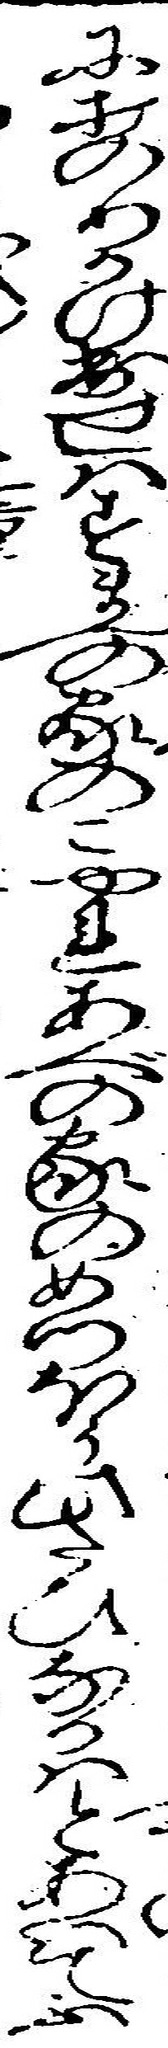に打のりかけ出せはすまんの家のこやれあべの家のめつほう此たひなるはとあはてふ
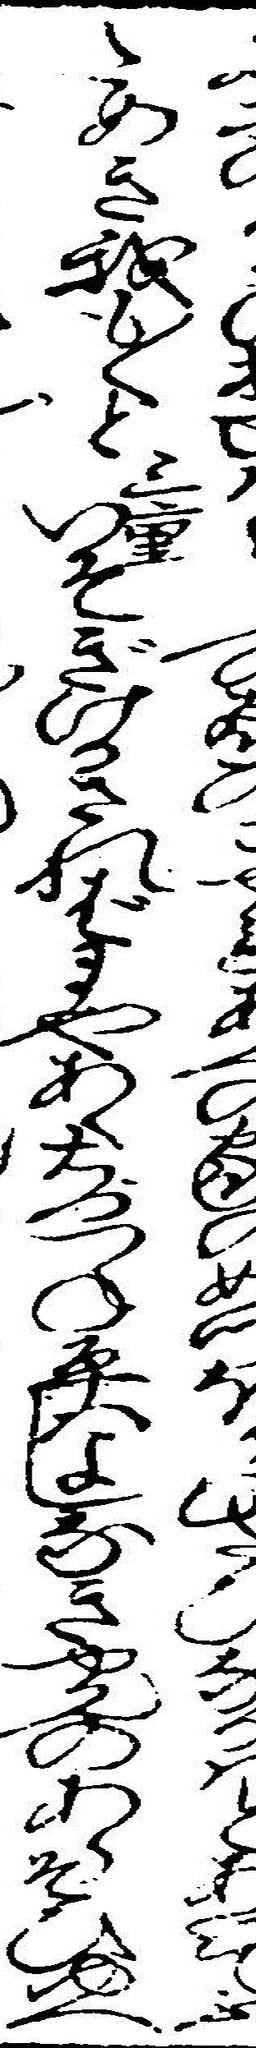ためき我も〳〵と三重いそぎけるさればにやあく右衛門つね平はよしなきやかんのあらそひゆへ
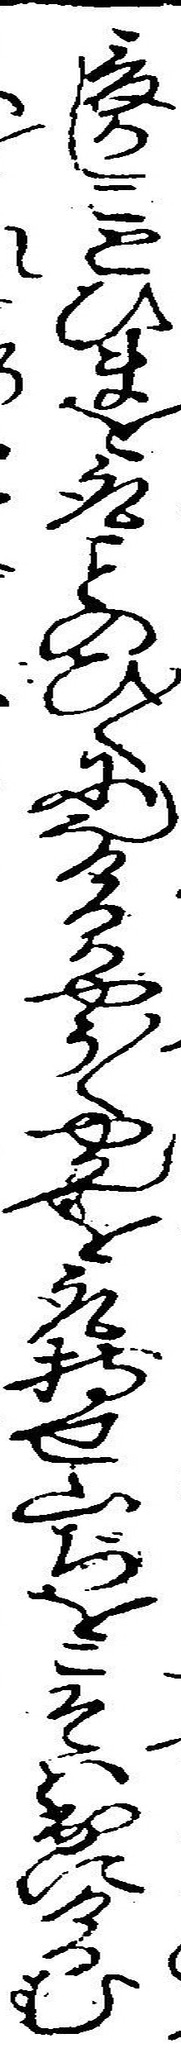爰かしことひまを取ことのひ〳〵に也けるかやう〳〵やかんを取持せ山ぢをこそは出にけるむ
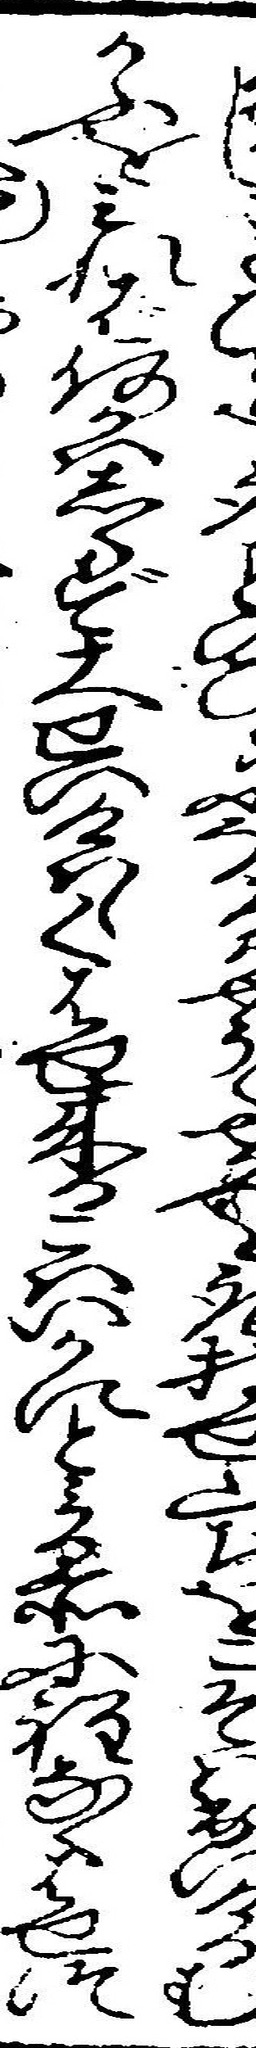かふをみれば何かはしらず大せいけはしくはせ来るこはいかにとみる所に程なくはせつ
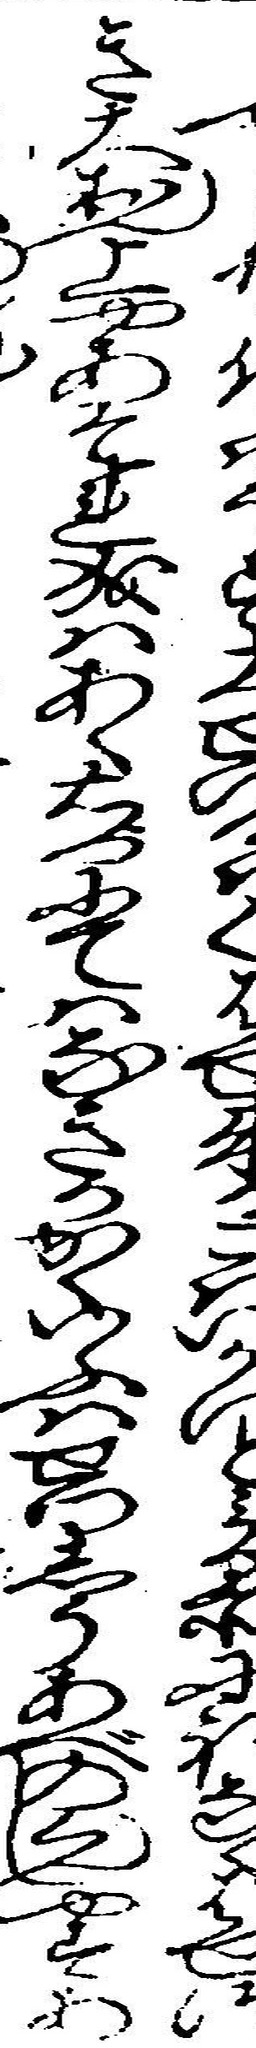き大おん上やあそれ成はあく右衛門にてはなきかかくいふはせつしうあべのくんしやすあ
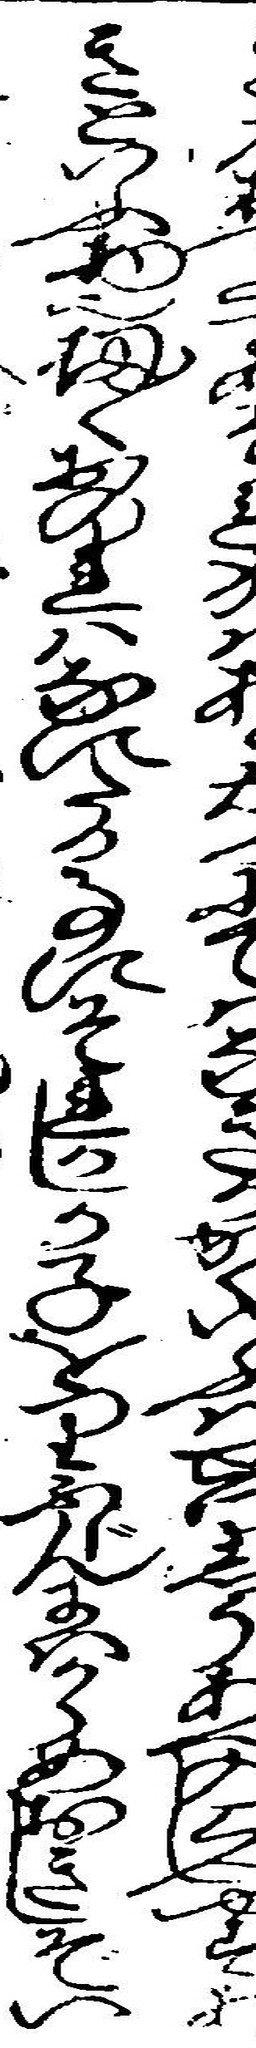きといふ物也扨〳〵おのれはなにたる事にそれかしか子をりふじんにはからめおきしぞい
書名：[しのだづまつりぎつね付あべの清明出生]
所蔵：東京大学総合図書館 General Library in the University of Tokyo, JAPAN
